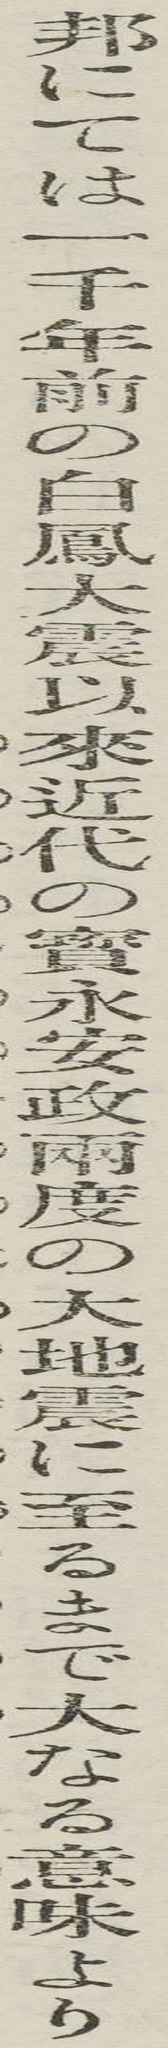邦にては一千年前の白鳳大震以来近代の宝永安政両度の大地震に至るまで大なる意味より
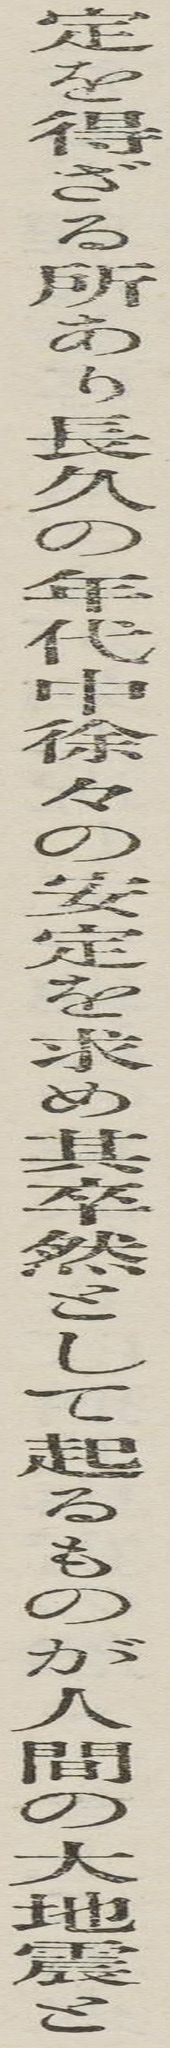定を得ざる所あり長久の年代中徐々の安定を求め其卒然として起るものが人間の大地震と
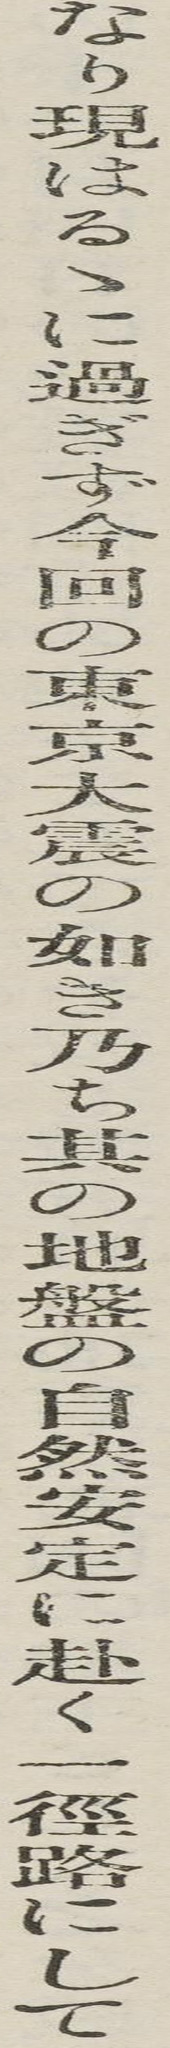なり現はるゝに過ぎず今回の東京大震の如き乃ち其の地盤の自然安定に赴く一徑路にして
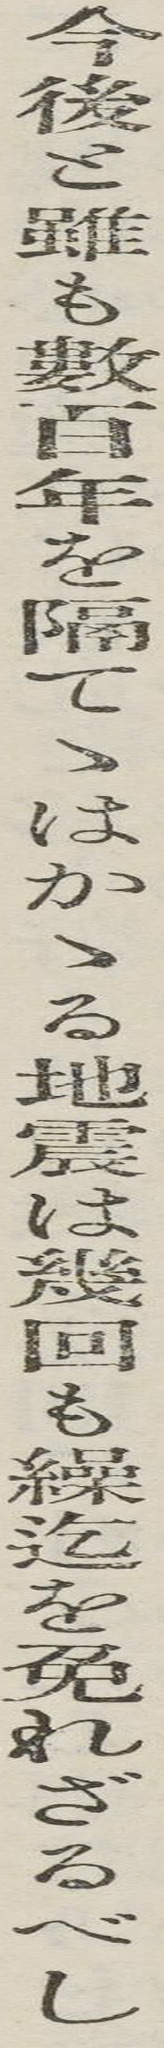今後と謂も数百年を隔てゝはかゝる地震は幾回も繰迄免れざるべし
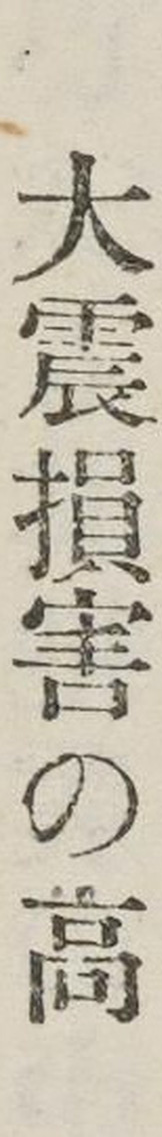大震損害高
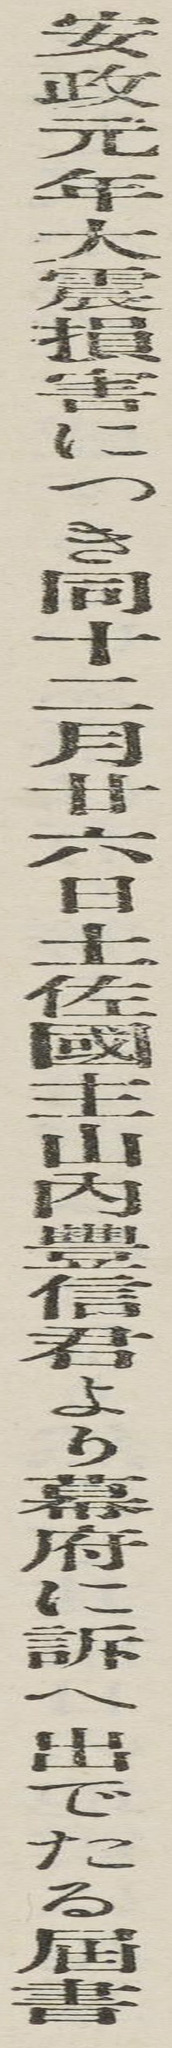安政元年大震損害につき同十二月廿六日土佐国主山内豊信君より幕府」に訴へ出たる届書
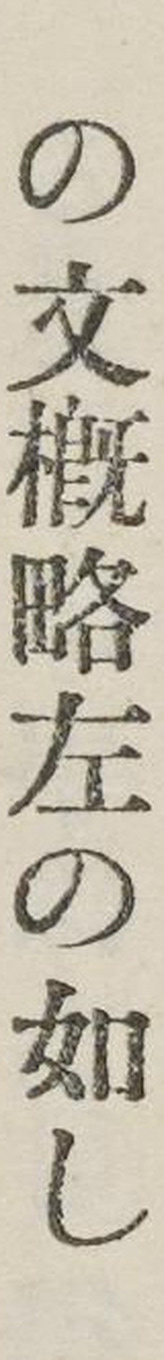の文概略左の如し
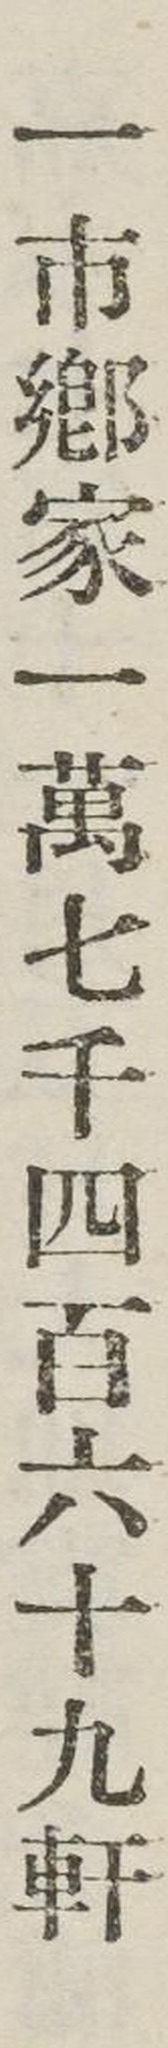一市郷家一万七千四百六十九軒
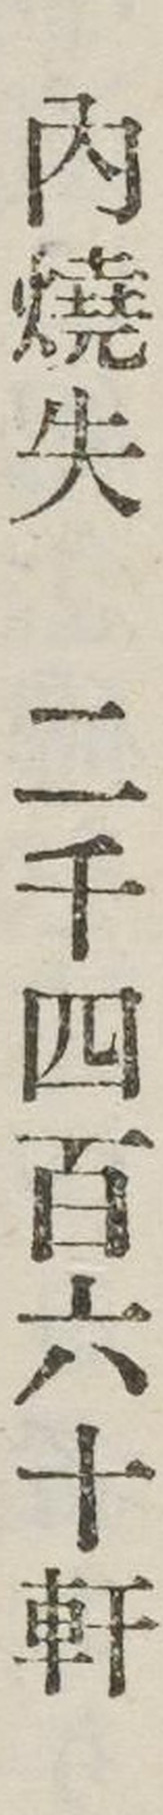内焼失二千四百六十軒
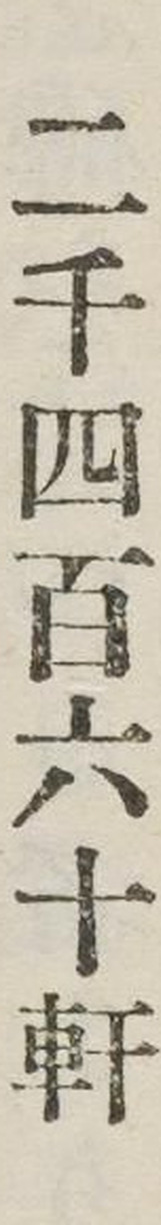内焼失二千四百六十軒
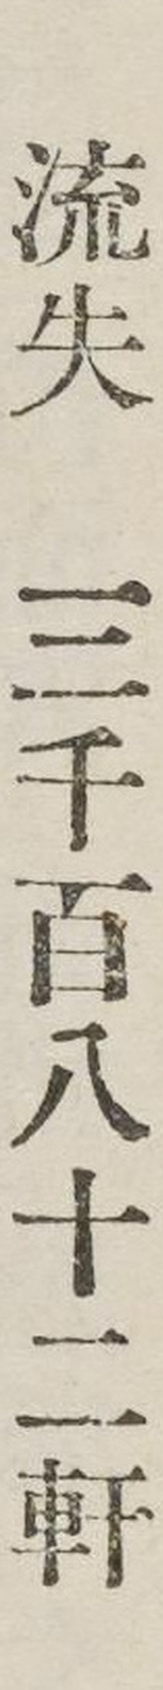流失三千百八十二軒
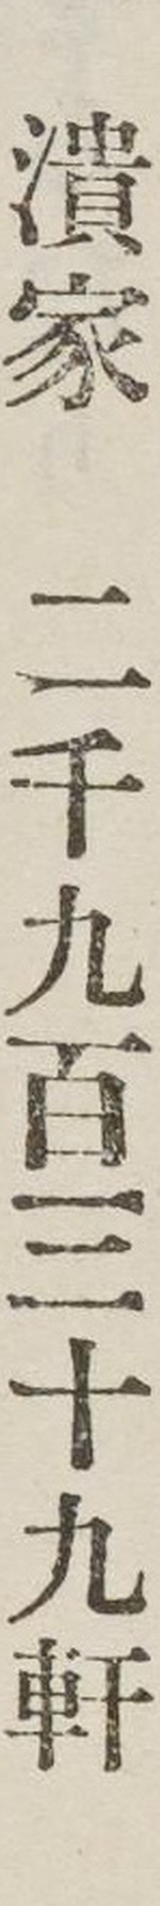潰家二千九百三十九軒
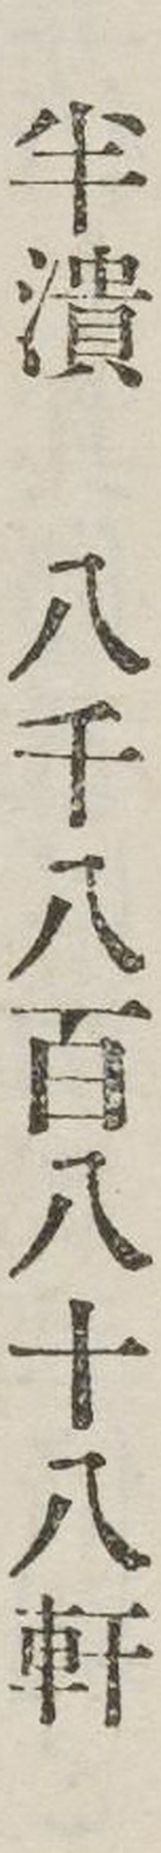半潰八千八百八十八軒
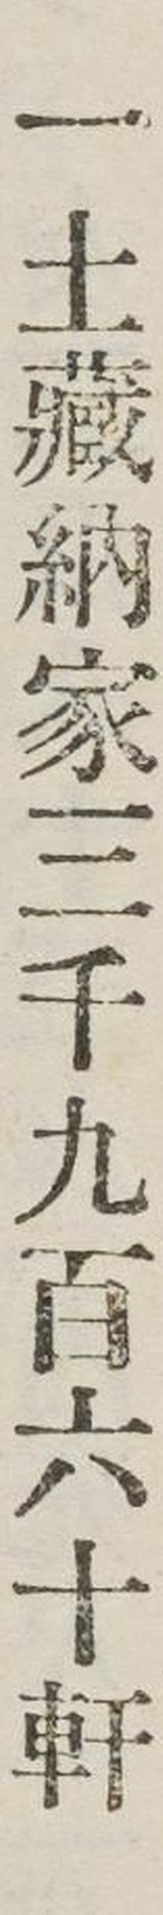一土蔵納屋三千九百六十軒
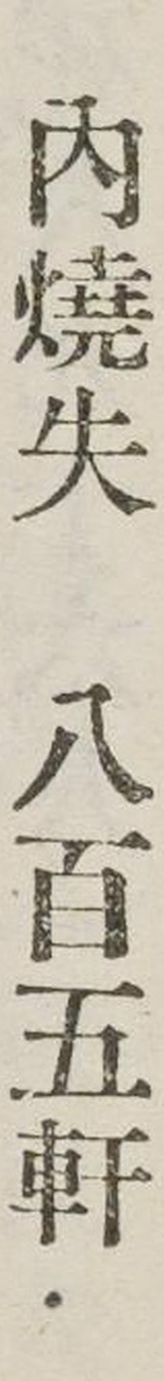内焼失八百五軒
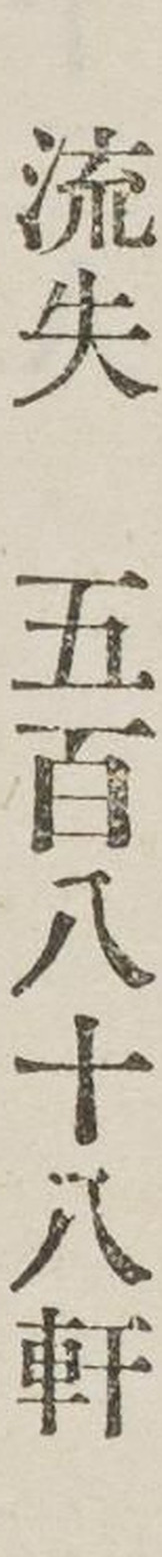流失五百八十八軒
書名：土佐古今ノ地震
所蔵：東京大学地震研究所図書室 Earthquake Research Institute Library, The University of Tokyo, JAPAN
